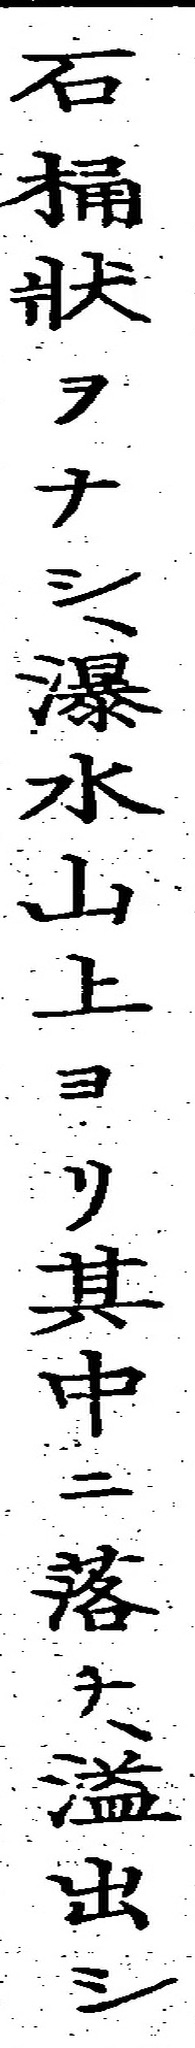石桶状ヲナシ、瀑水山上ヨリ其中ニ落チ、溢出シ
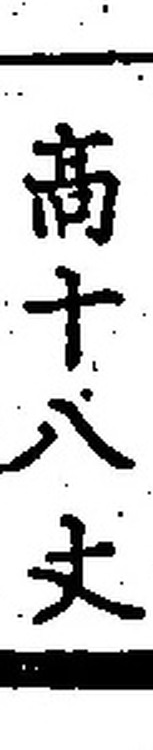高十八丈
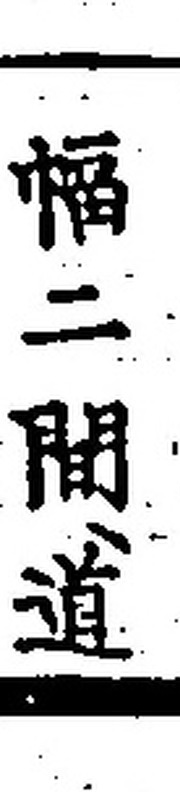幅二間、道
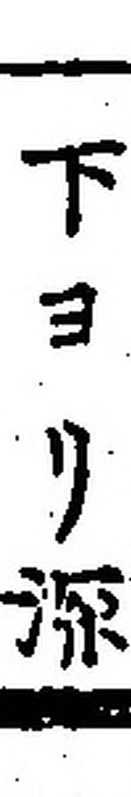下ヨリ深
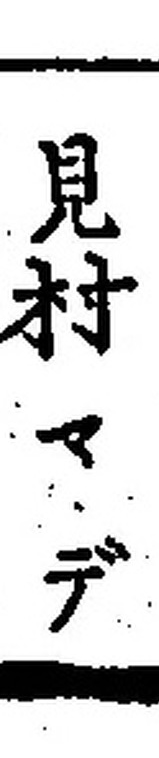見村マデ
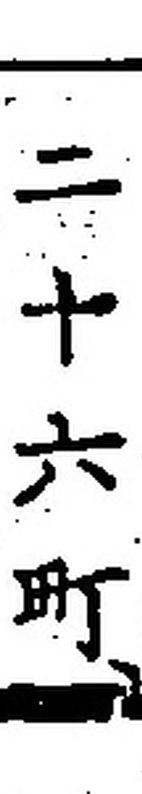二十六町、
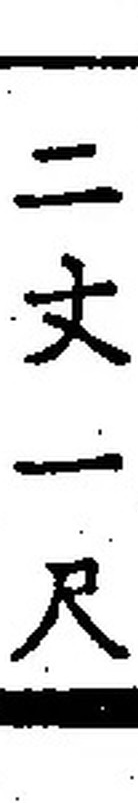二丈一尺
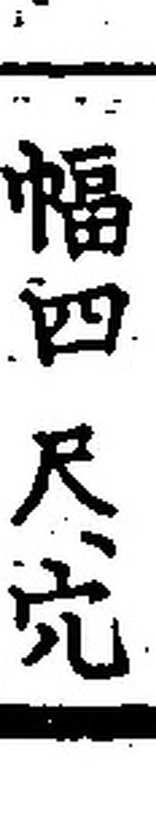幅四尺、穴
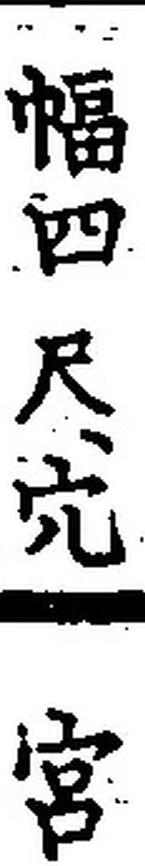幅四尺、穴
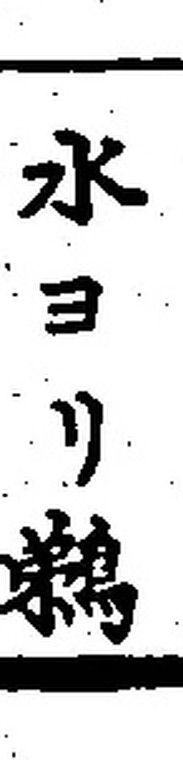水ヨリ鵜
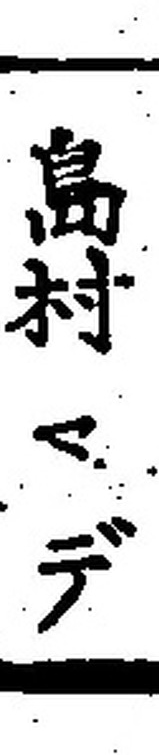島村マデ
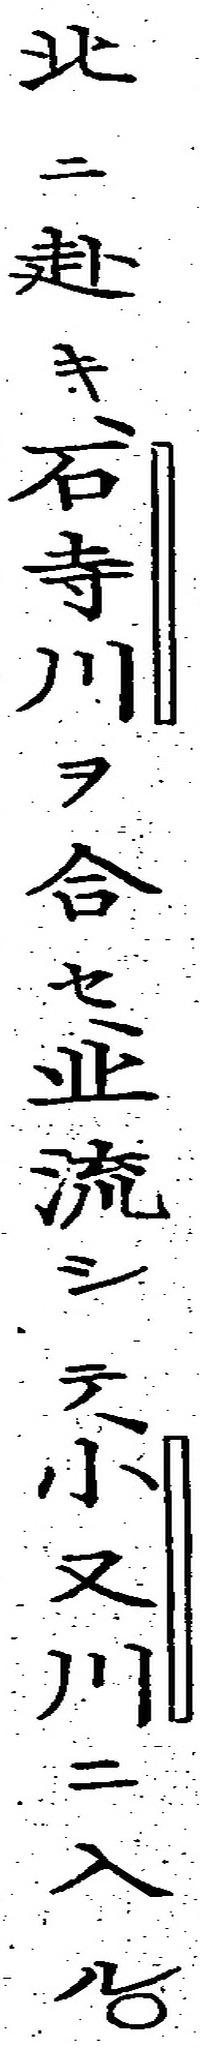北ニ赴キ、石寺川ヲ合セ、北流シテ、小又川ニ入ル。
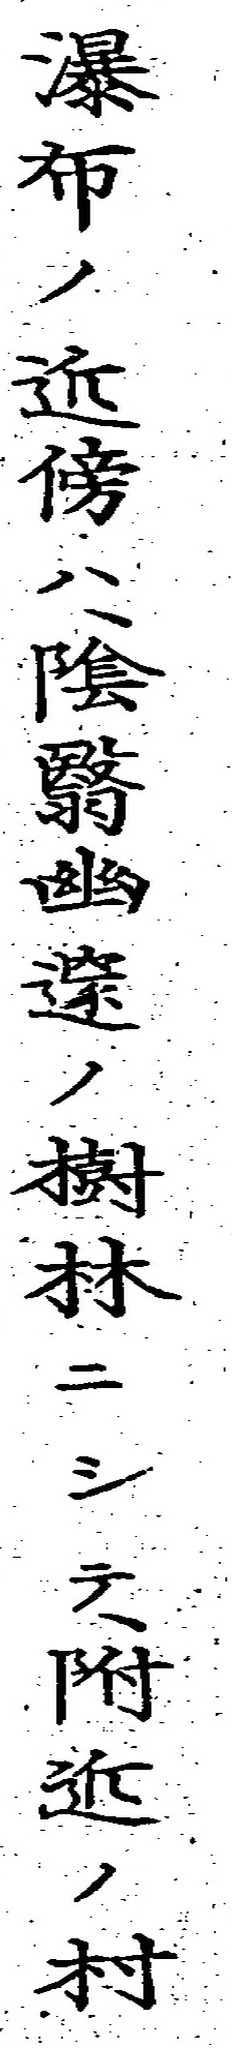瀑布ノ近傍ハ、陰翳幽邃ノ樹林ニシテ、附近ノ村
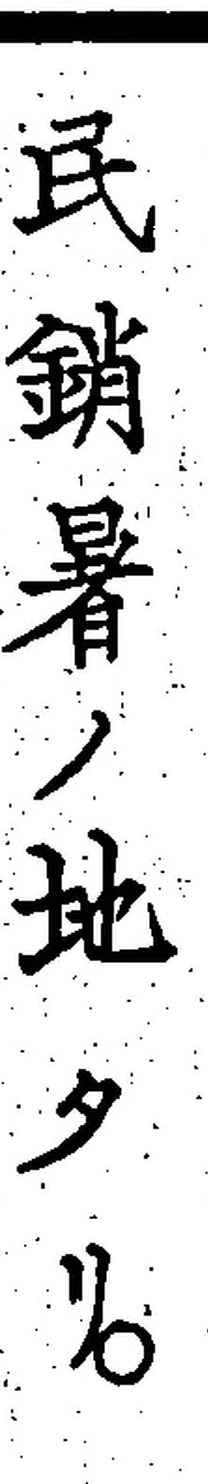民銷暑ノ地タリ。
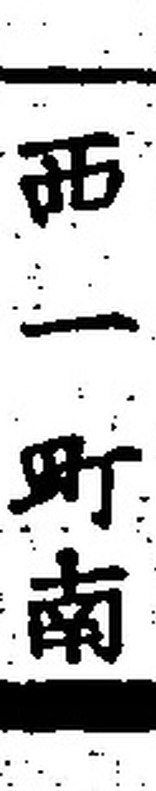西一町南
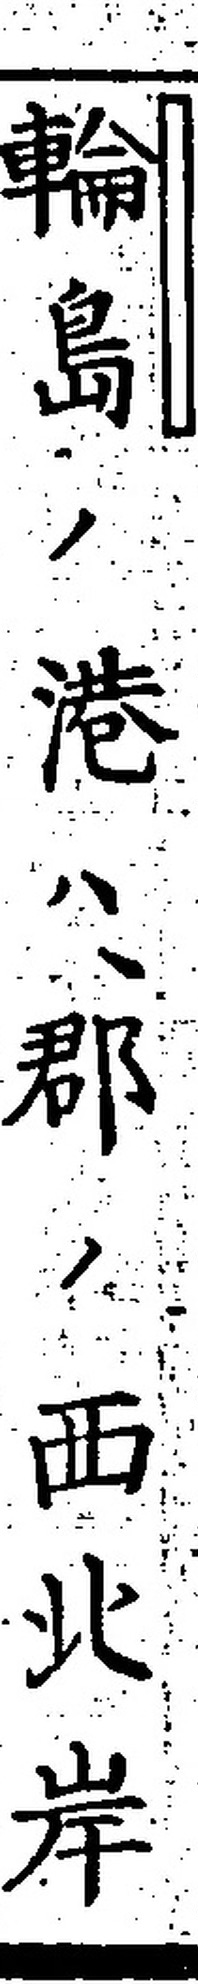輪島ノ港ハ、郡ノ西北岸
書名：能登地誌略
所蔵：国立国会図書館 National Diet Library, JAPAN
